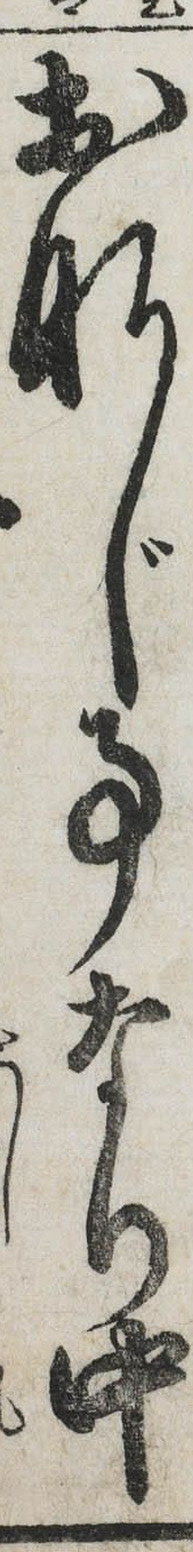おなじ事なり中
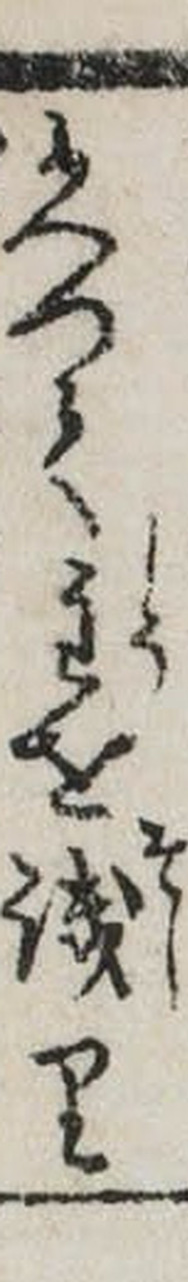かへつて主を譏り
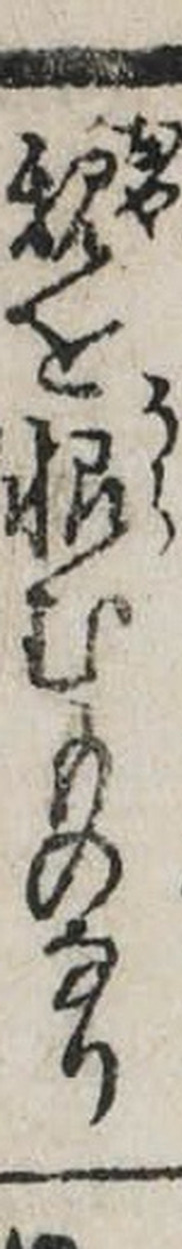親を恨むものなり
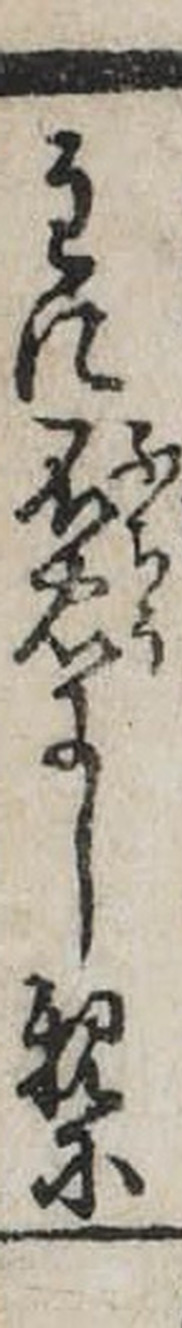主に不忠にし親に
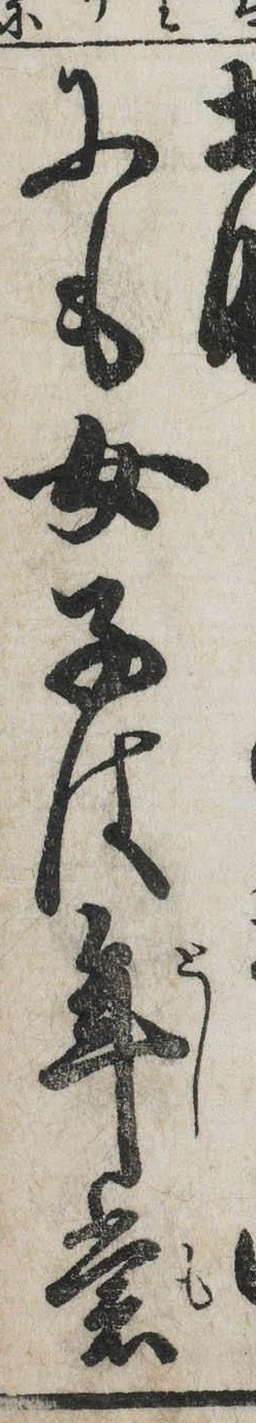にも女子は年裳

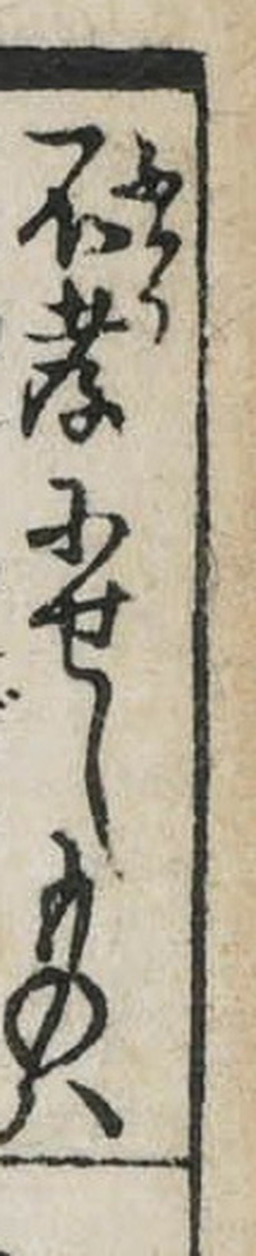不幸にせしものは
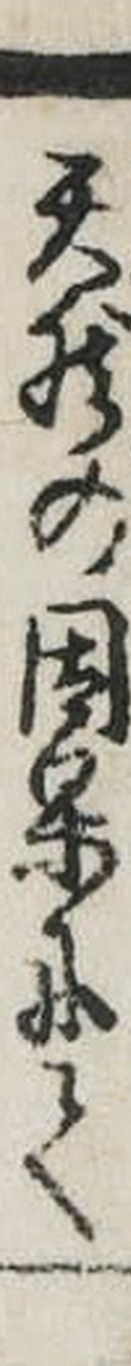天然の因果にて
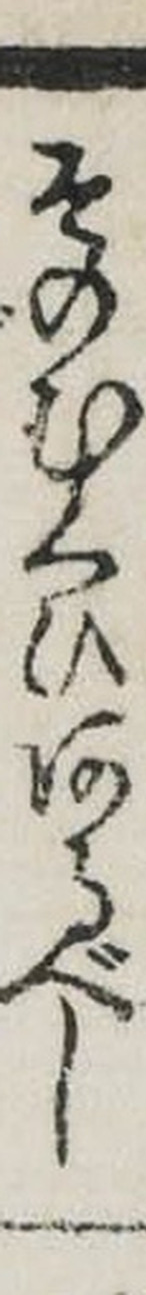そのむくひあるべし
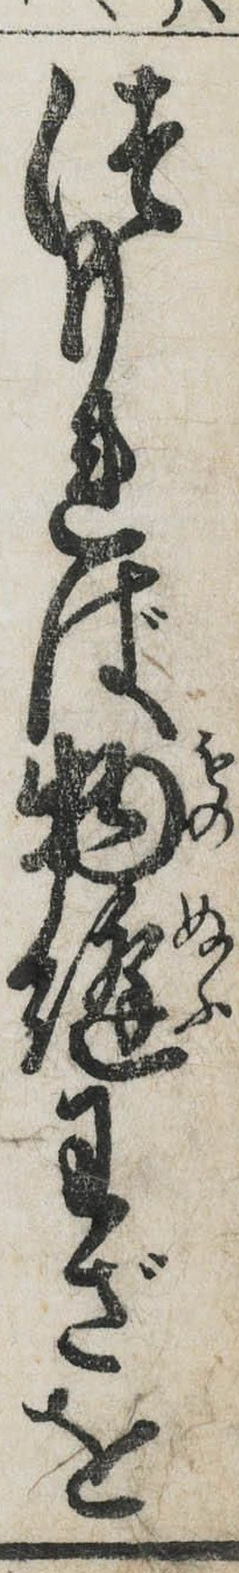つもれば物縫わざを
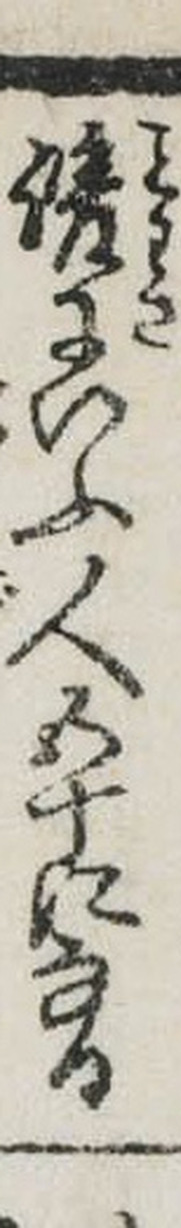諺にいふ人五十になる
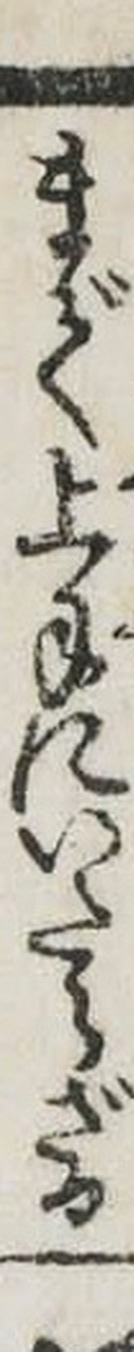まで上手にいたらざる
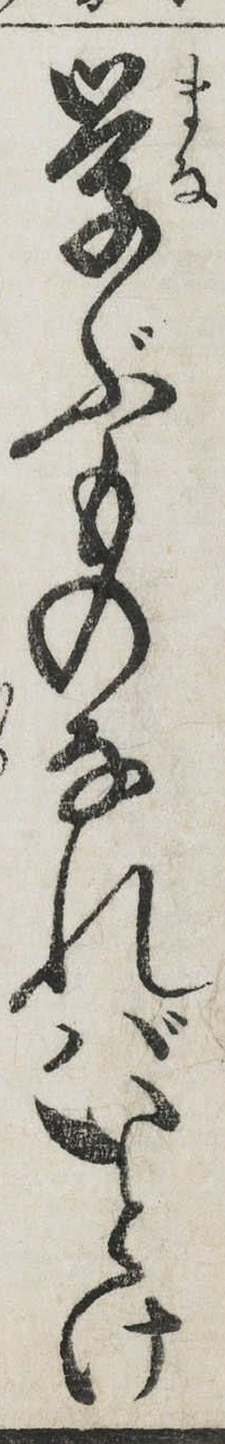学ぶものなればいとけ
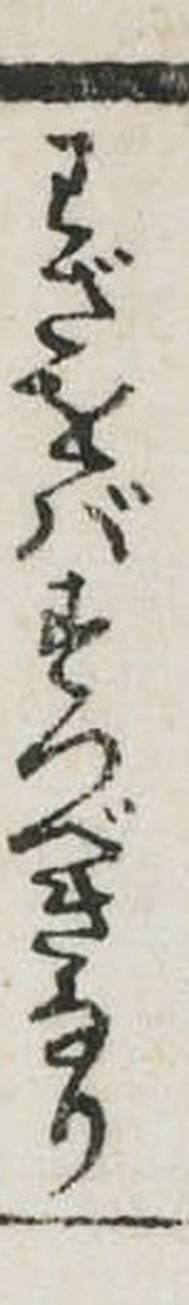わざをばすつべきなり
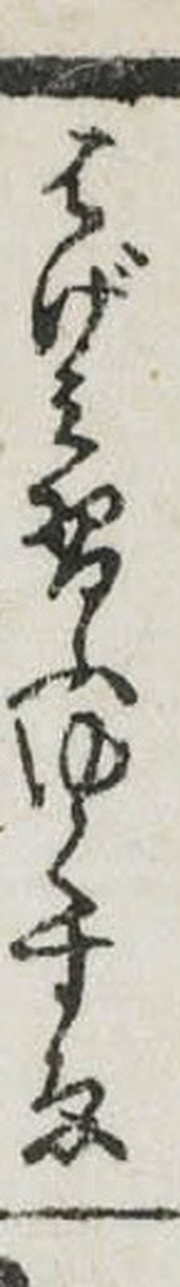はげみ習ふゆくすゑ
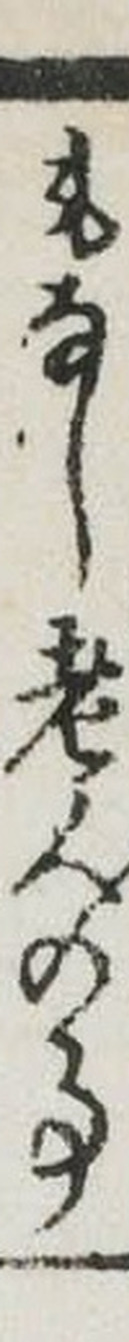もなし老人の事
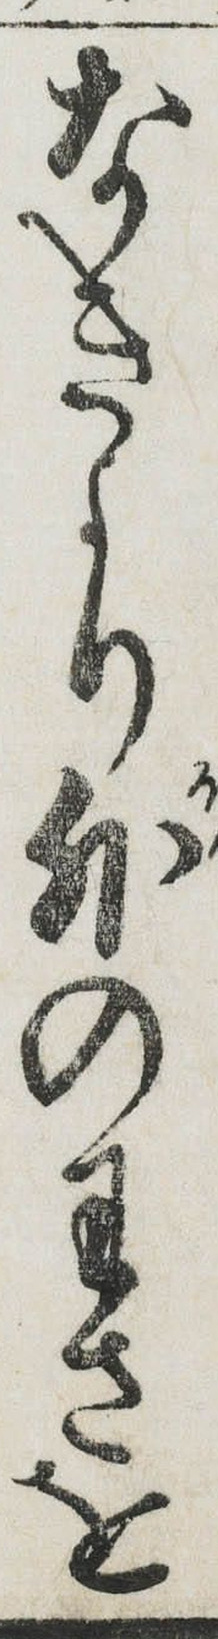なきより外のわさを
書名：頭書萬用婦人手紙之文言
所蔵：東京学芸大学教育コンテンツアーカイブ
